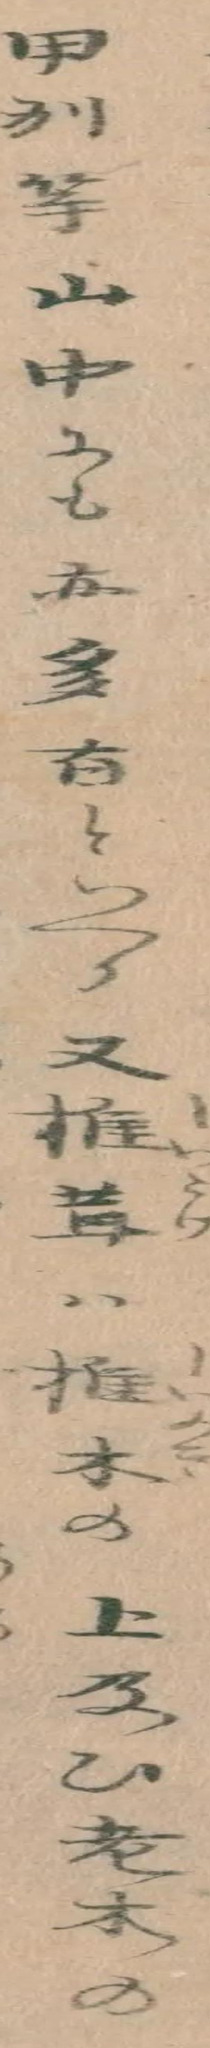甲州等山中にも亦多有といへり又椎茸は椎木の上及ひ老木の
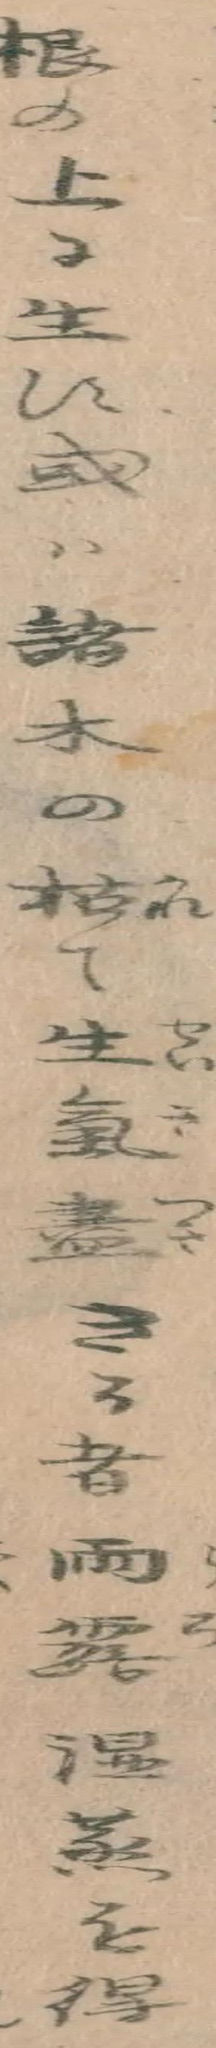根の上に生す或は諸木の枯て生気尽きる者雨露湿蒸を得
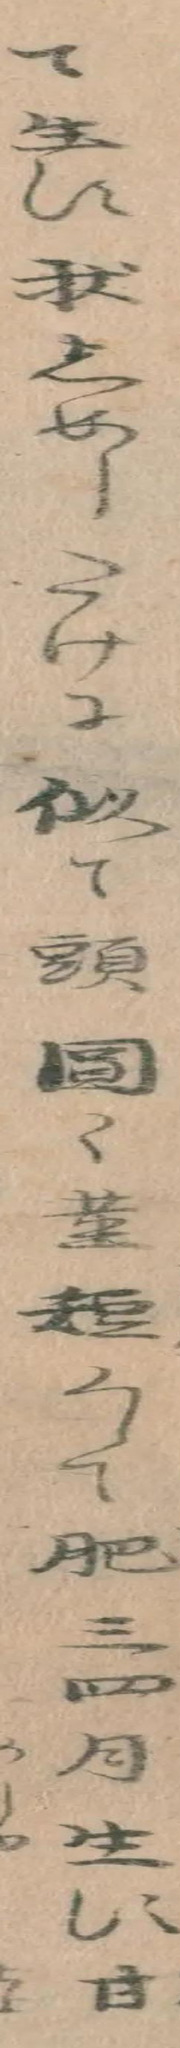て生す状しめしたけに似て頭円く茎短くして肥三四月生す甘
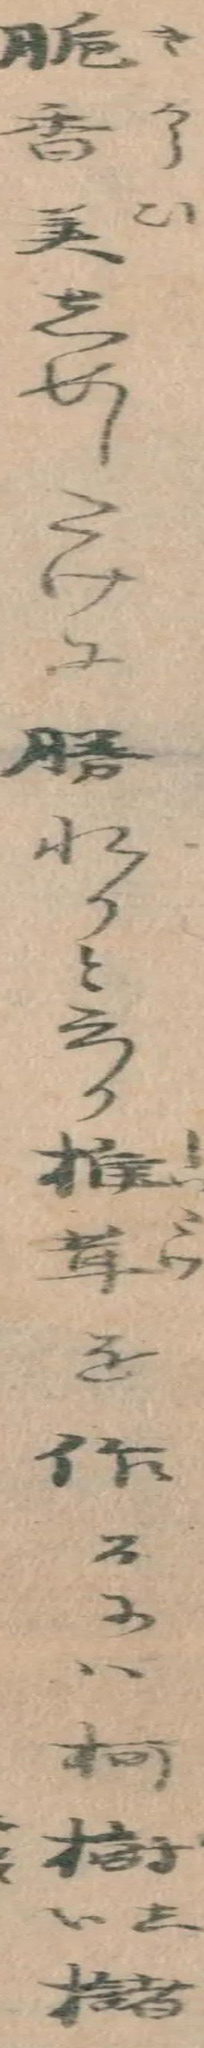脆香美しめしたけに勝れりと云り椎茸を作るには柯樹しい櫧
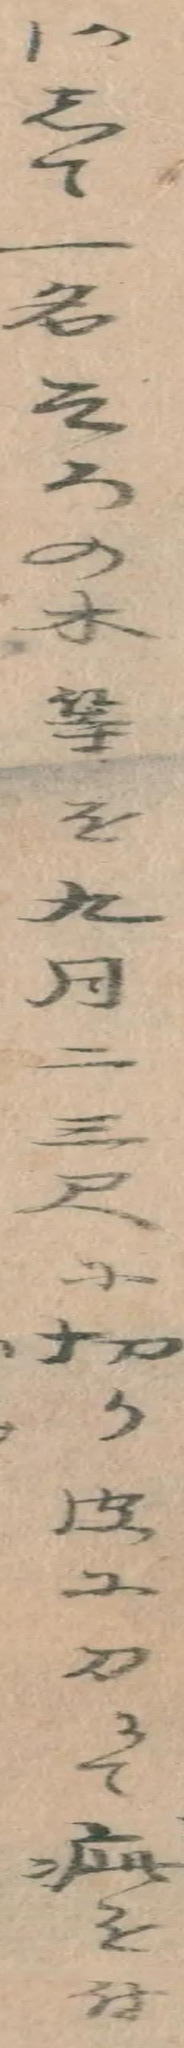かしして一名そろの木等を九月二三尺に切り皮に刀にて疵を付
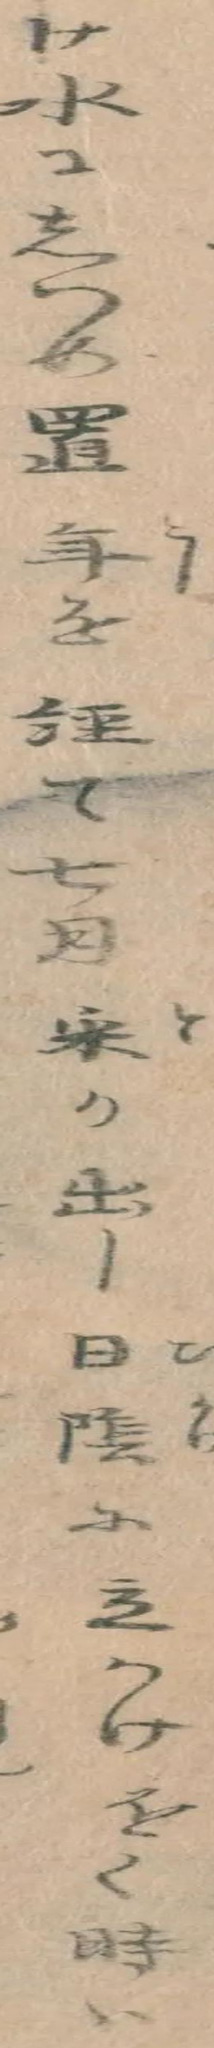け水にしつめ置年を経て七月采り出し日陰に立かけをく時は
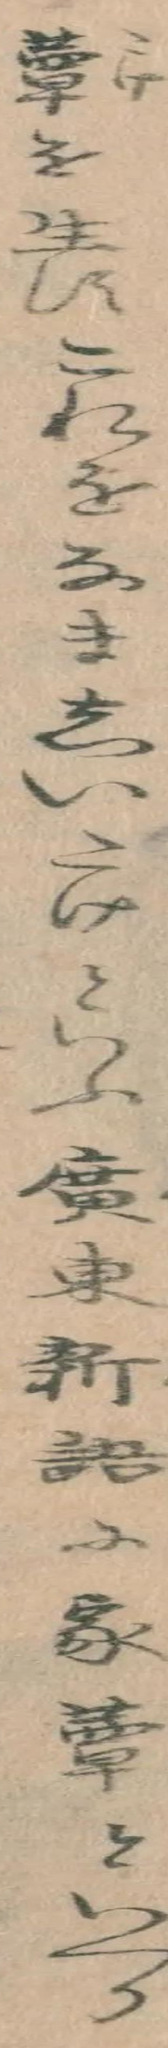蕈を生すこれをなましいたけといふ広東新語に家蕈といへり
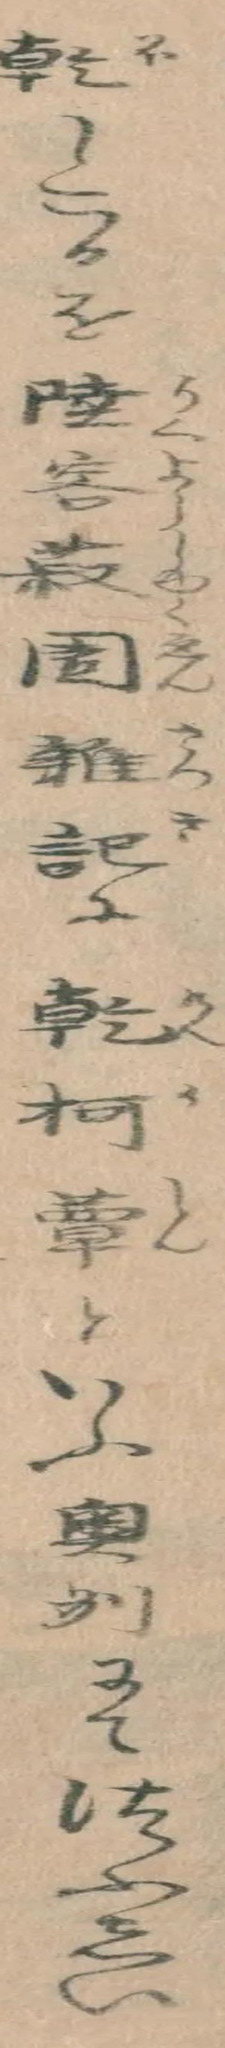乾したるを陸容菽園雑記に乾柯蕈といふ奥州にてつふしい
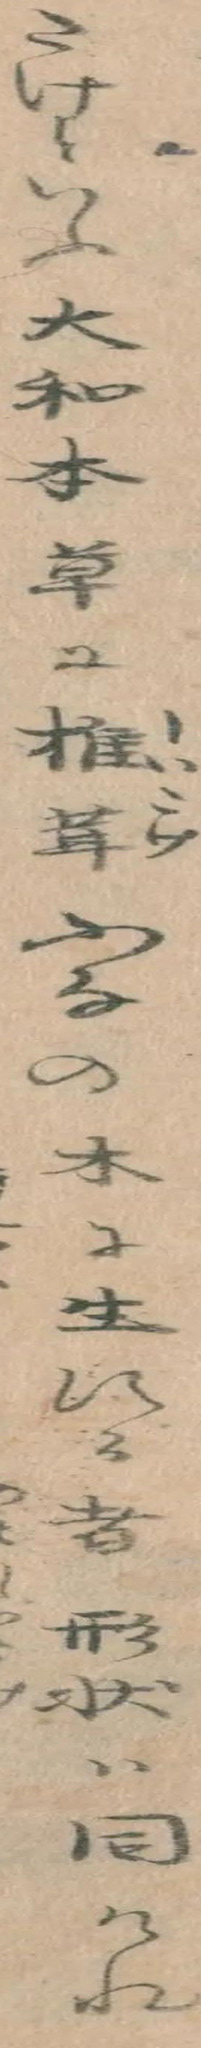たけといふ大和本草に椎茸ふなの木に生する者形状は同けれ
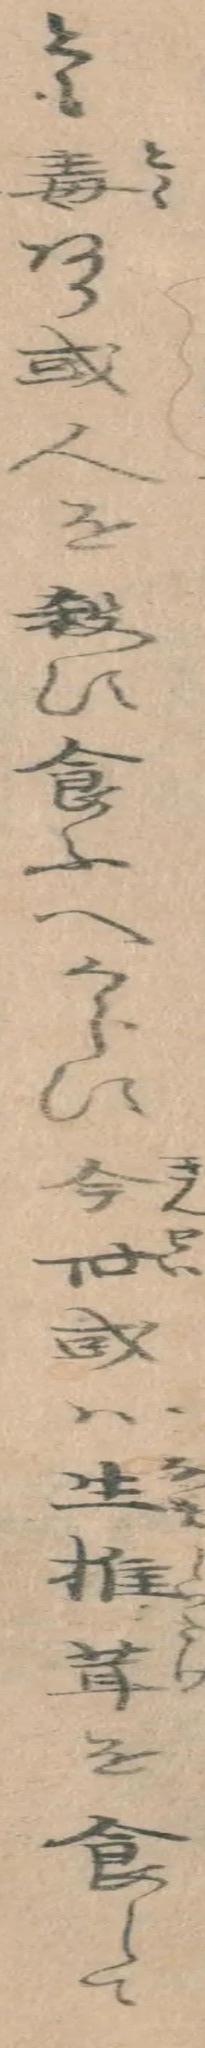とも毒あり或人を殺す食ふへからす今世或は生椎茸を食して
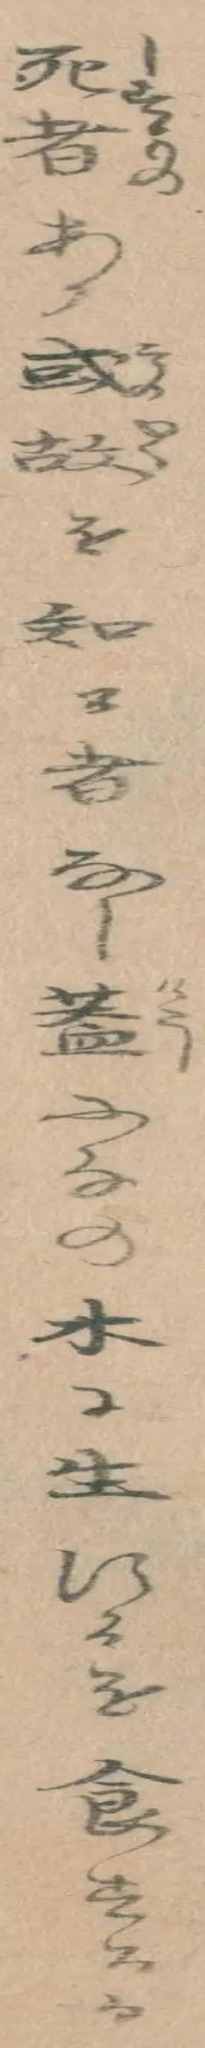死者あり或故を知る者なし蓋ふなの木に生するを食するか
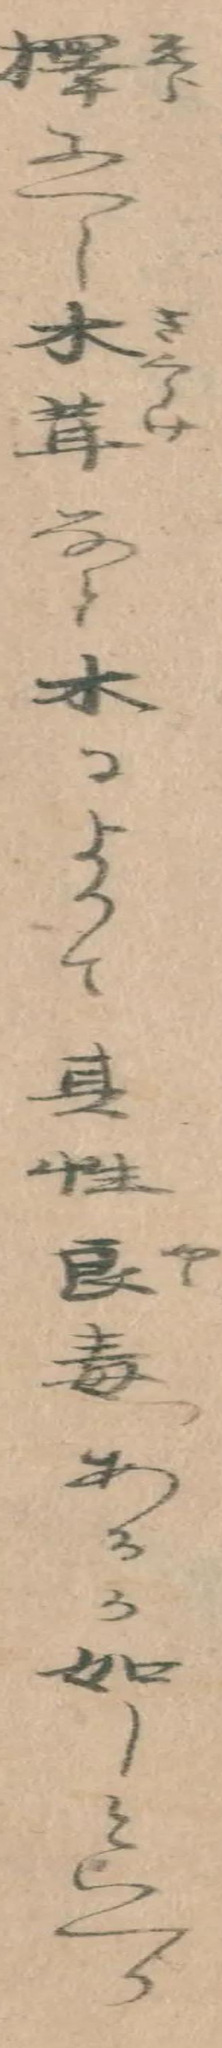択ふへし木茸なと木によりて其性良毒あるか如しといへり

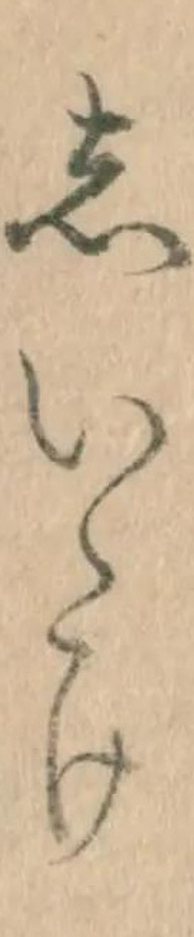しいたけ
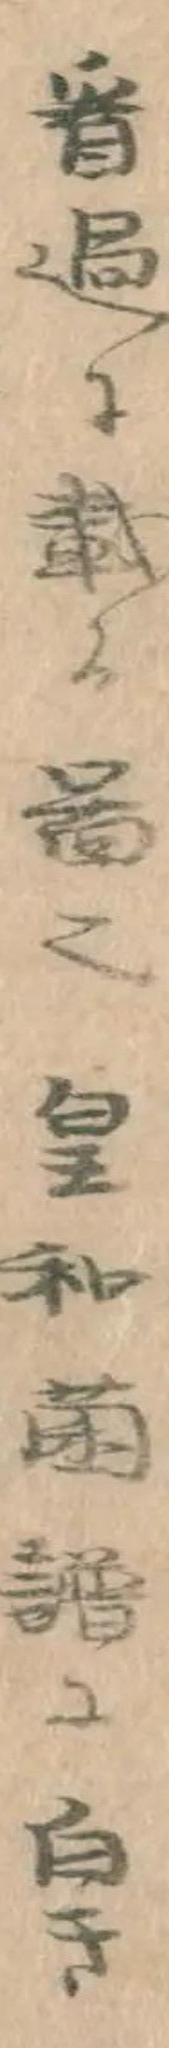看過に載る図也皇和菌譜に白き
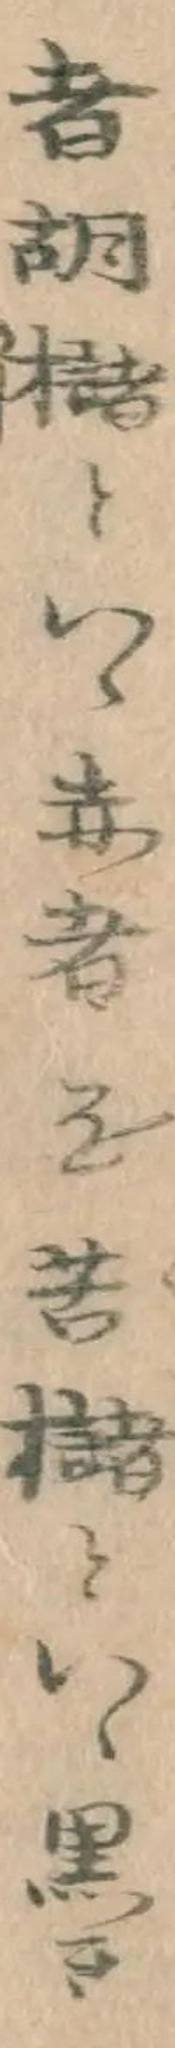者胡櫧といゝ赤者を苦櫧といゝ黒き
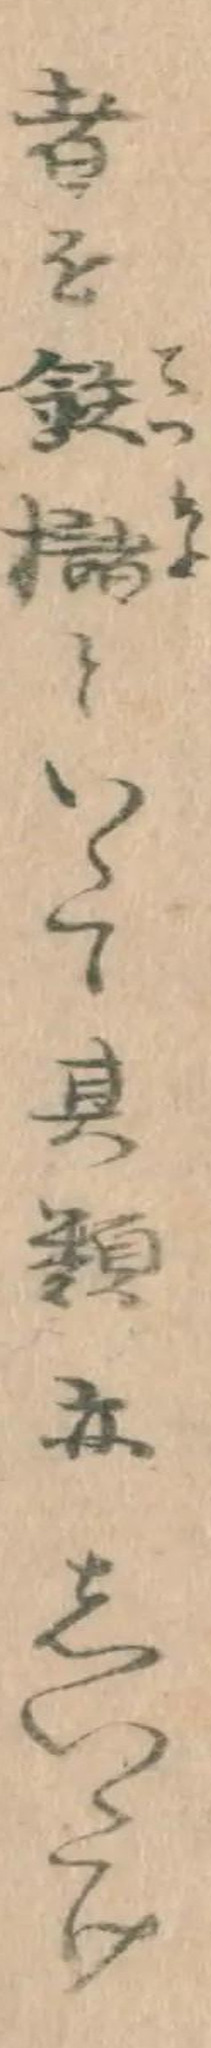者を鉄櫧といゝて其類亦しいたけ
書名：本草図譜. 巻55-57
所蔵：国立国会図書館 National Diet Library, JAPAN
